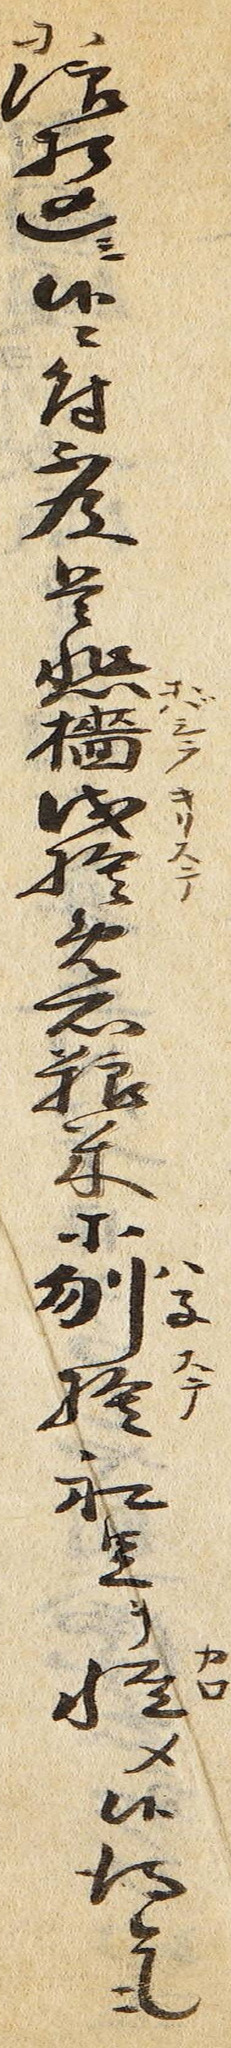に浪打込み候に付不及是悲檣伐捨免石粮米等刎捨船足軽メ候得とも
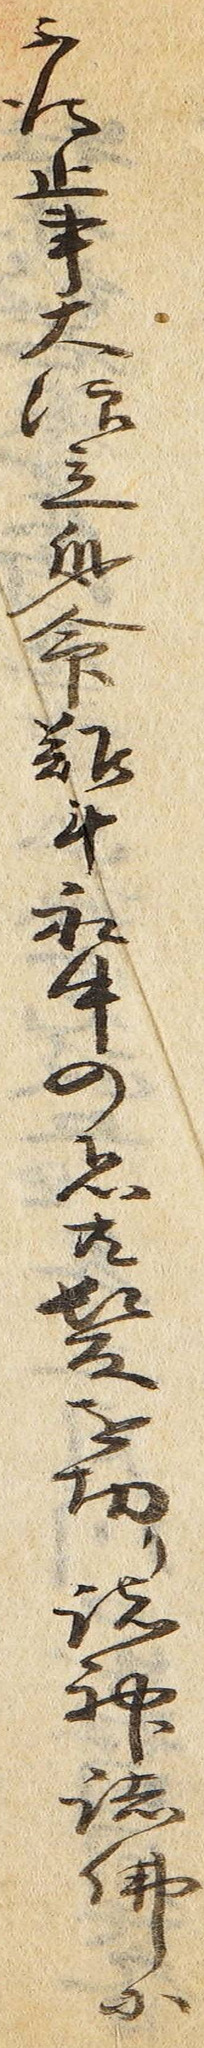不得止事大浪立身命難計船中の者共髪を切り諸神諸仏に
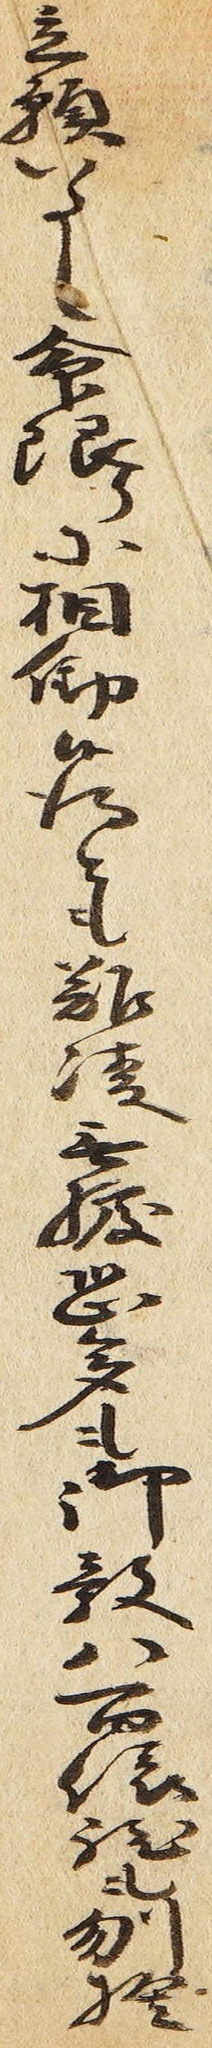立願いたし命限りに相働候得とも難凌無拠恐多も御穀八百俵然も刎捨
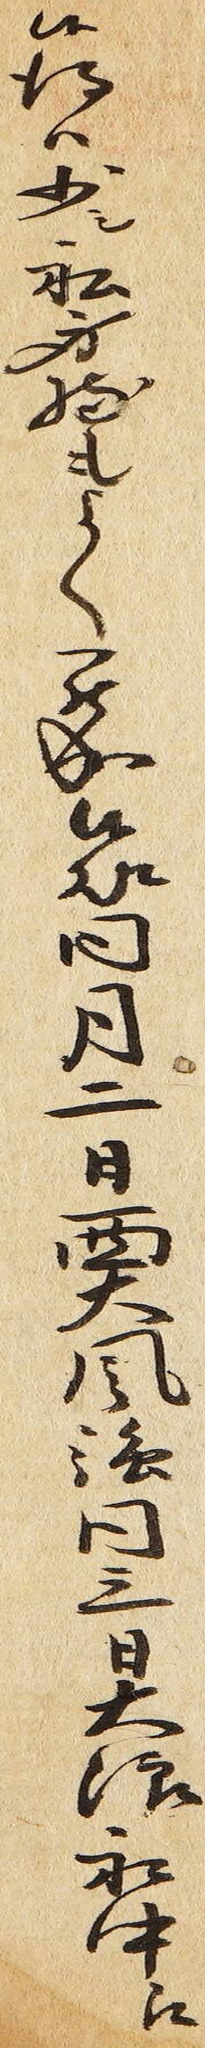候得は少し船身持もよく罷成候処同月二日西大風強同三日大浪船中え
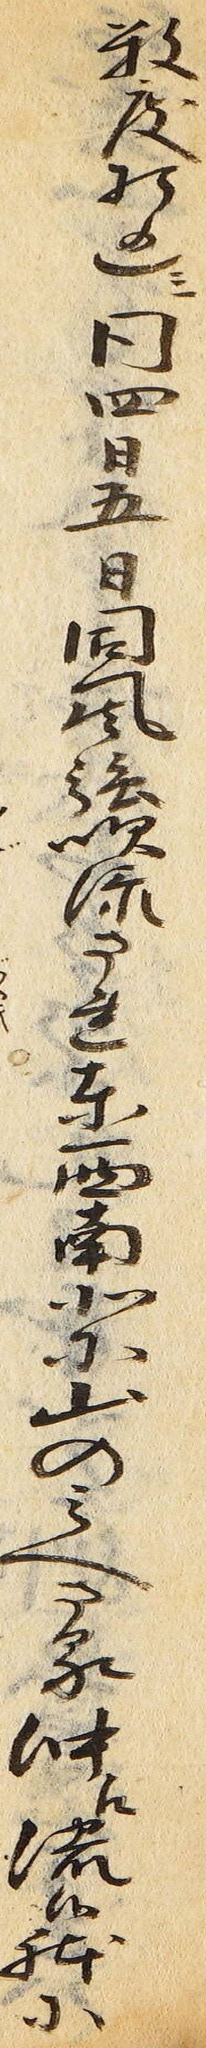数度打込み同四日五日同風強吹流され東西南北に山のみへさる沖え流候躰に
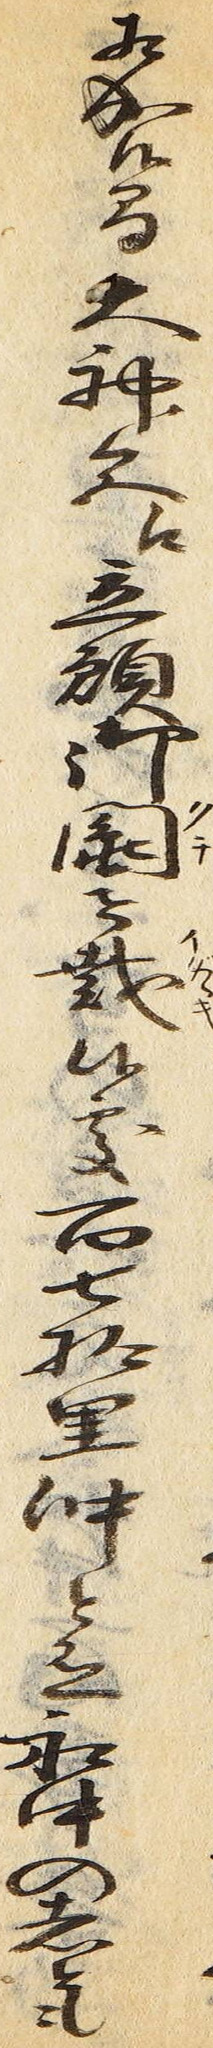相成候間大神宮え立願御鬮を戴候処百七拾里沖と有船中の者とも
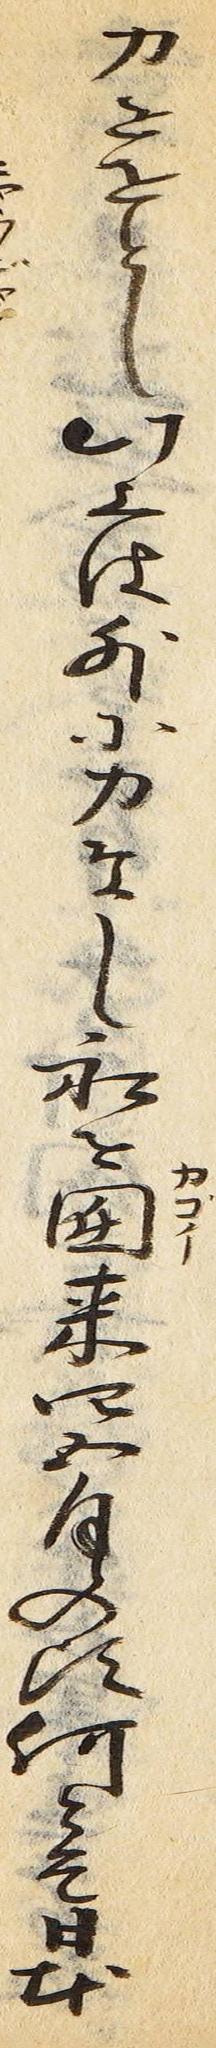力ををとし此上は外に力なし船を囲来四五月の頃日本
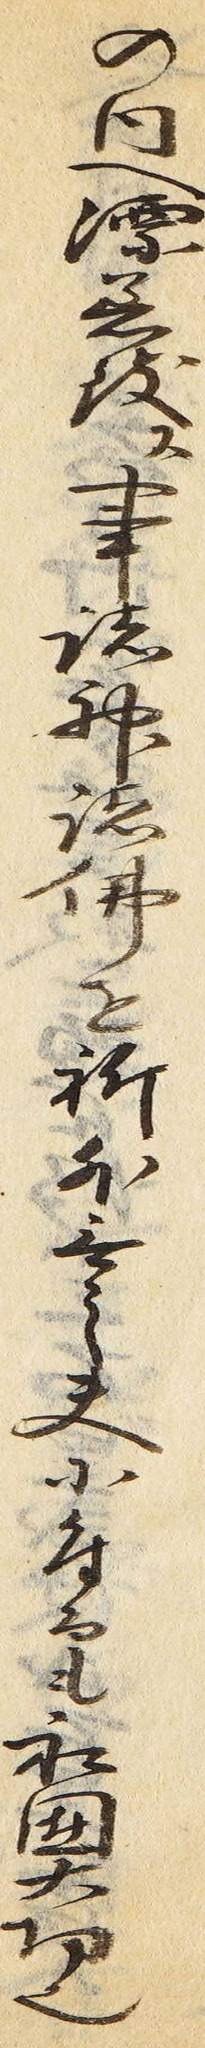の内へ漂着致事諸神諸仏を祈外無之夫に付而も船囲大切也
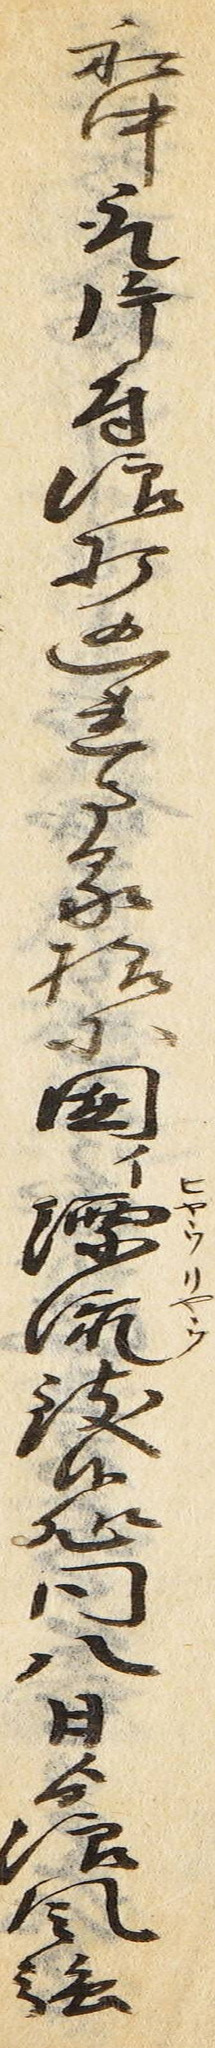船中取片付浪打込れさる様に囲漂流致候処同八日ゟ浪風強
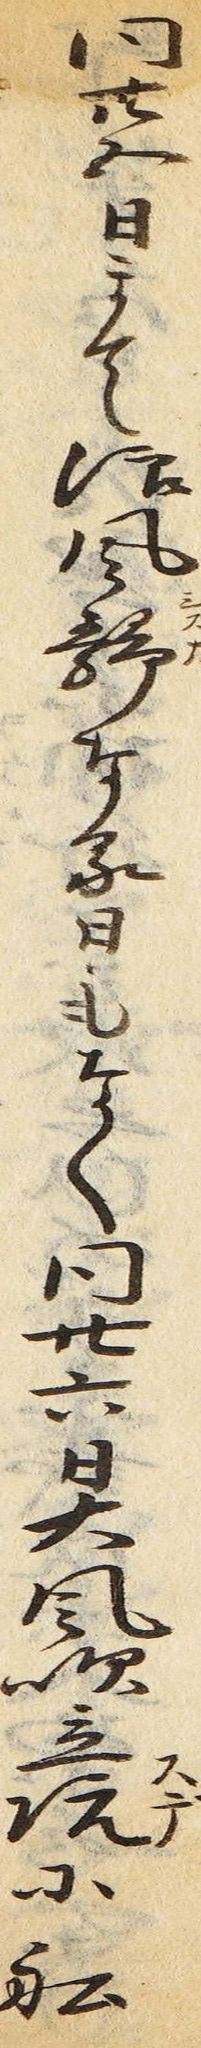同廿五日まて浪風静なる日もなく同廿六日大風吹立既に船
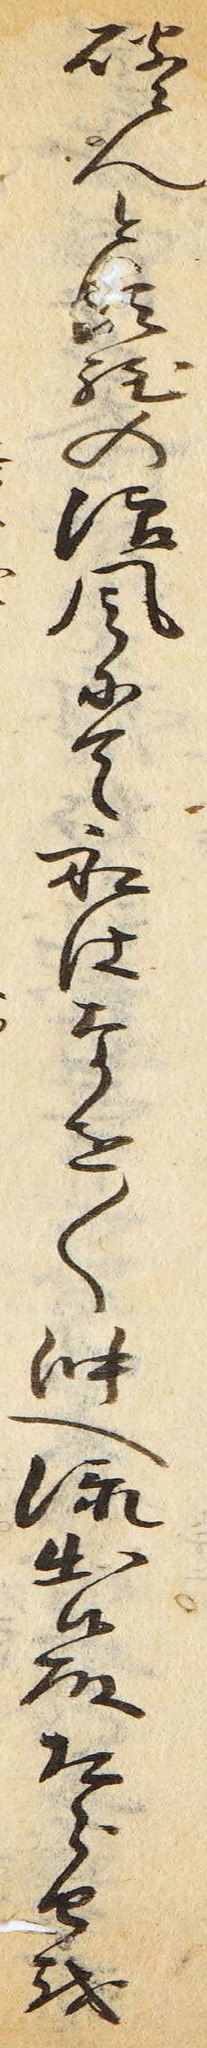破らんと頃然の浪風にて船はなを〳〵沖へ流出候故たらせを
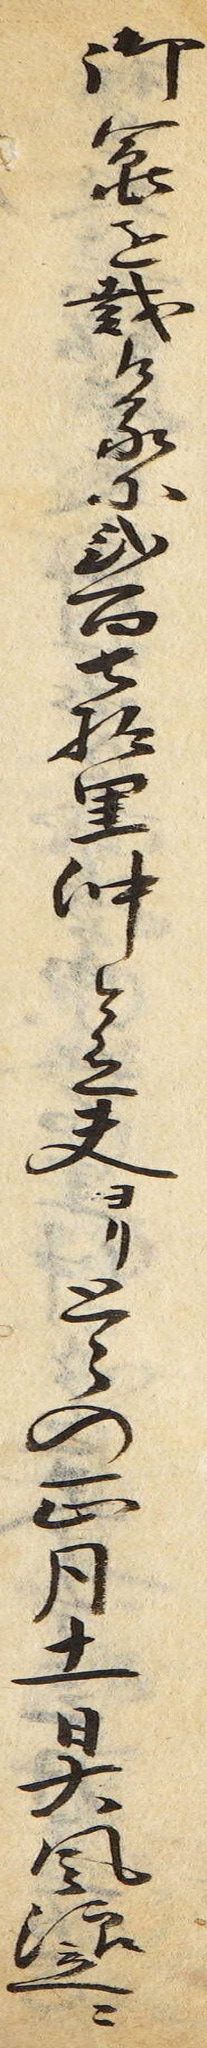御鬮を戴けるに弐百七拾里沖と有夫とらの正月十一日大風浪立

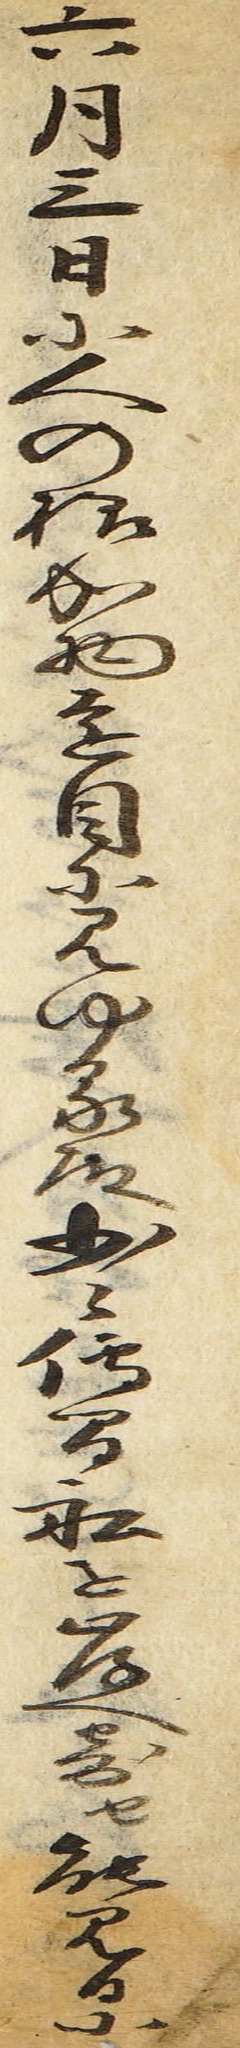六月三日に人の様成物遠目に見ゆる故小々伝間船を岸へ寄せ能見るに
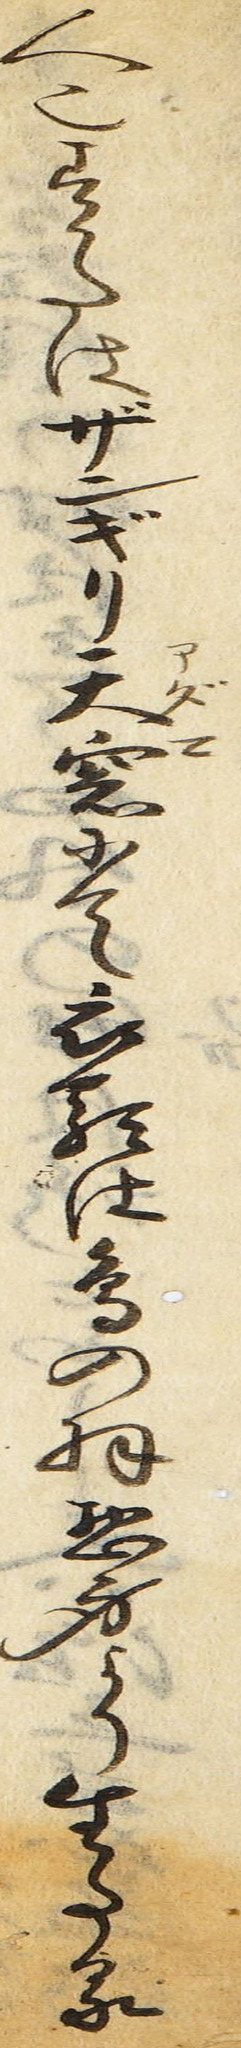人也すかたはザンギリ天窓にて衣類は鳥の羽惣身より生るる
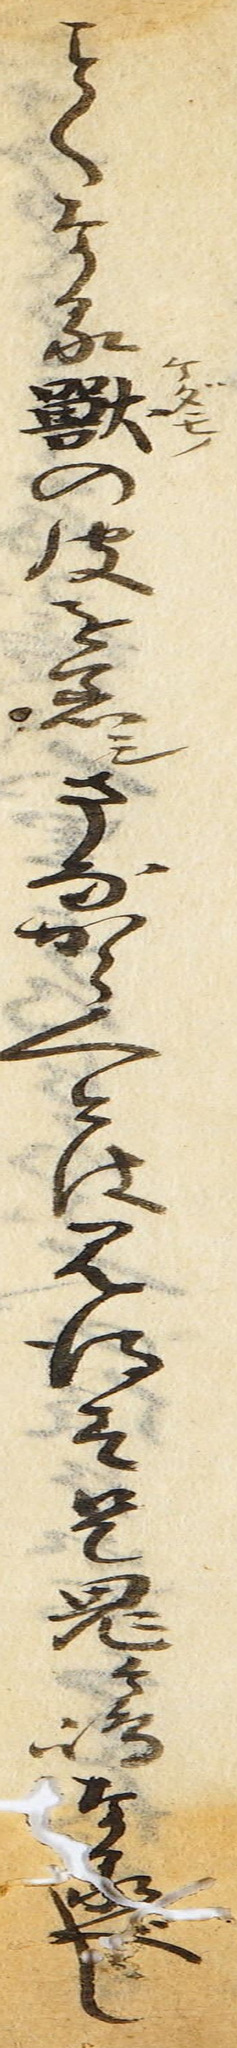ことくなる獣の皮を着シさなから人とは見得す是鬼ヶ嶋なるべし
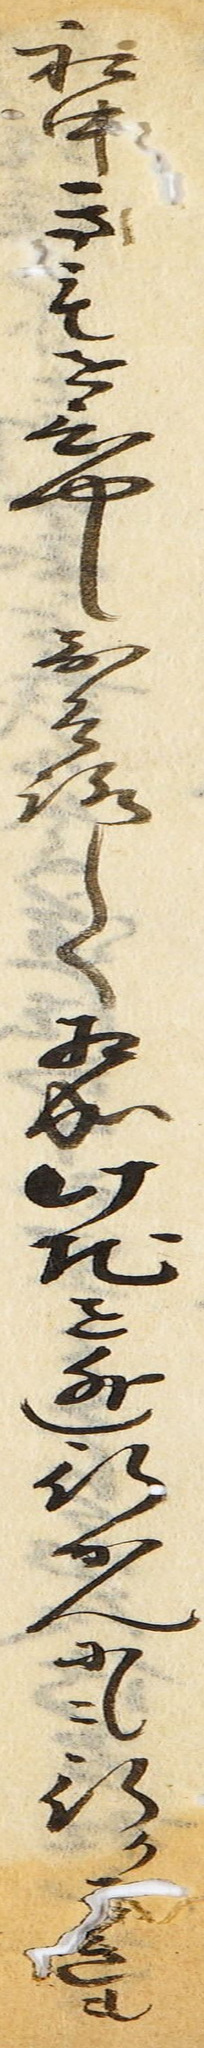船中きもをひやしおそろしく相成此地を逃行かんにも行ㇰきも
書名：外国漂流記
